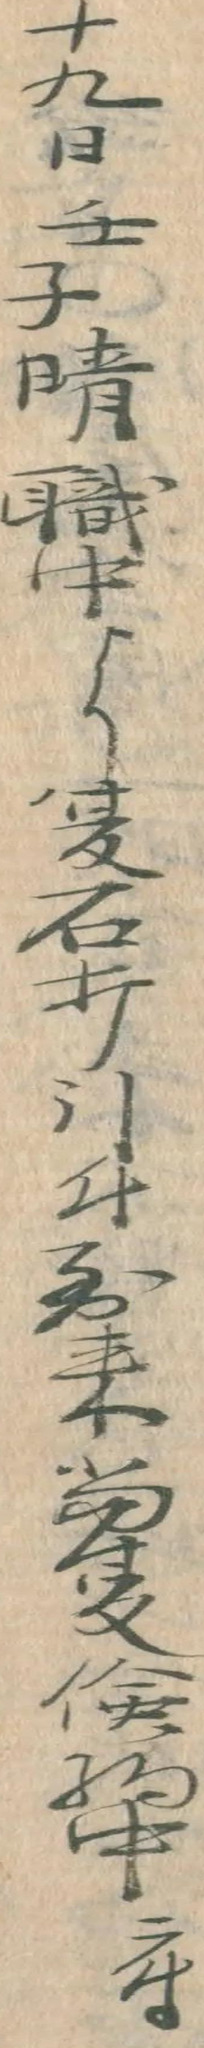十九日壬子晴職中より夏石打引付到来当夏倹約中に付
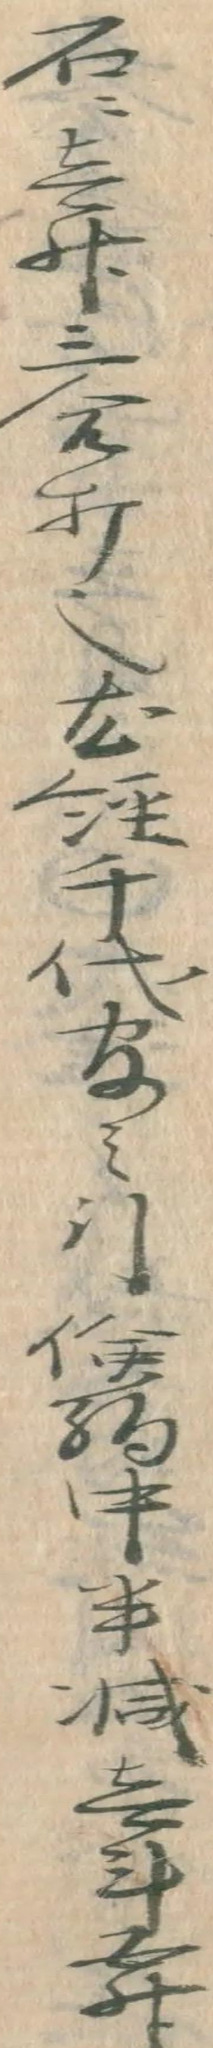石ニ壱升三合打也尤経千代官之引倹約中半減壱斗五升
